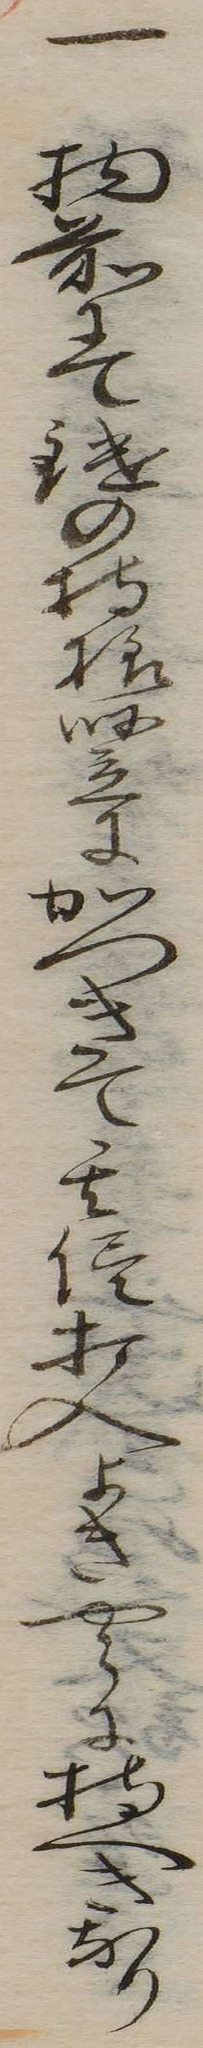一物前にて鑓の持様竪にかつきて其侭打入よきやうに持へきなり

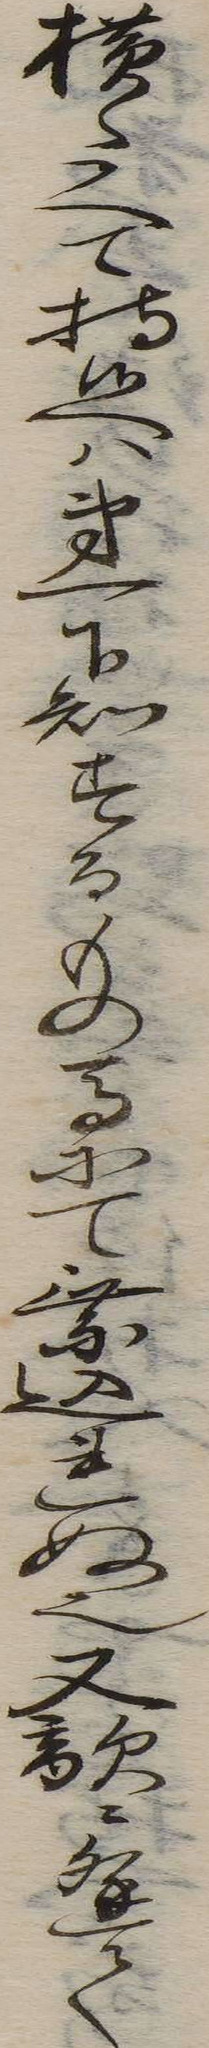横たへて持候へは第一下知するもの馬にて乗込れぬ也又敵ニ逢て
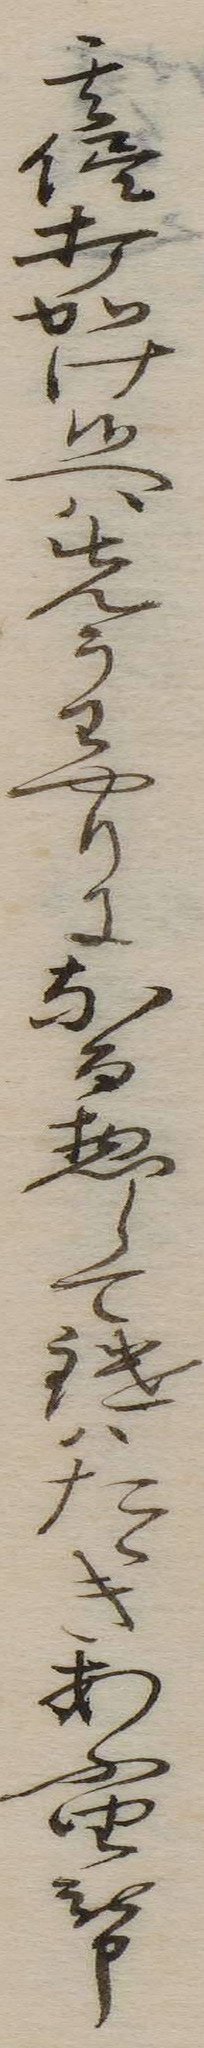其侭打かけ候へは先うわやりになる惣して鑓はたゝきあふ由被申
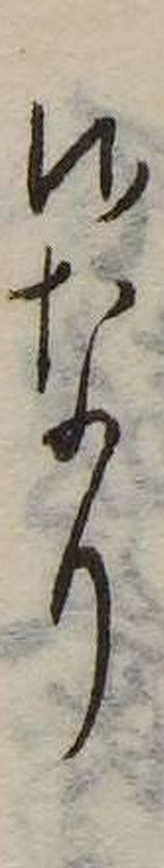候なり
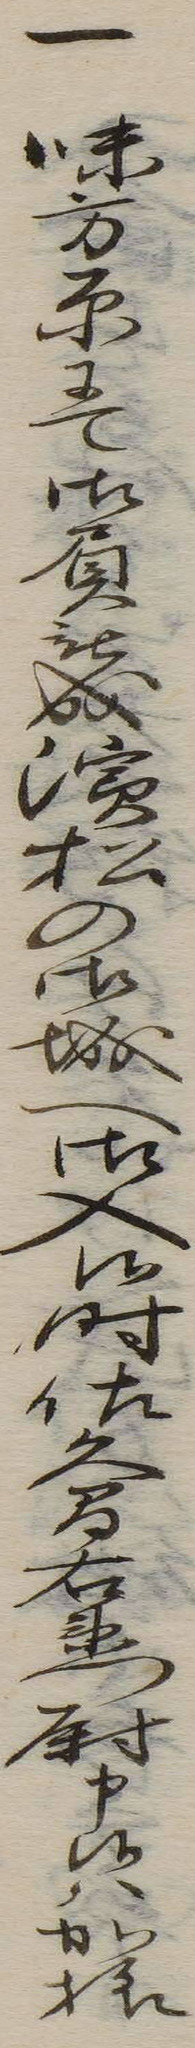一味方原にて後負被成浜松の御城へ御入候時佐久間右衛門尉申候はか様
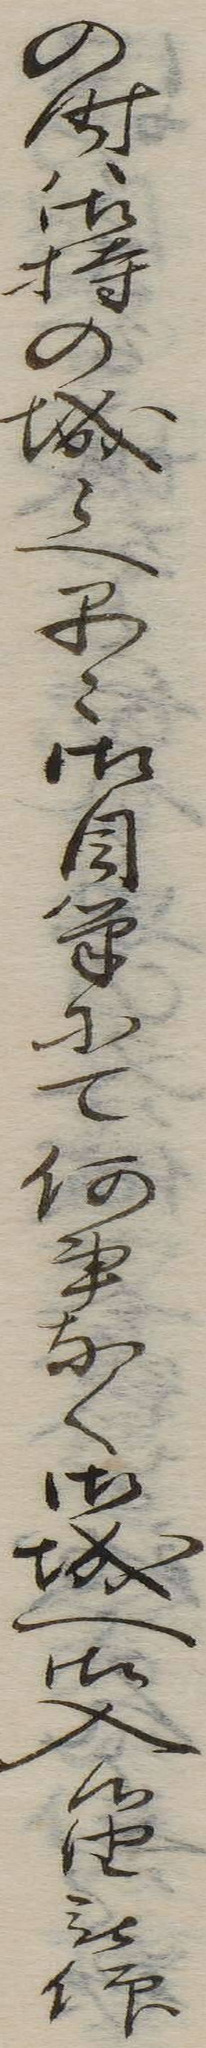の時は御持の城々へ早々御自筆にて何事なく御城へ御入候由被仰
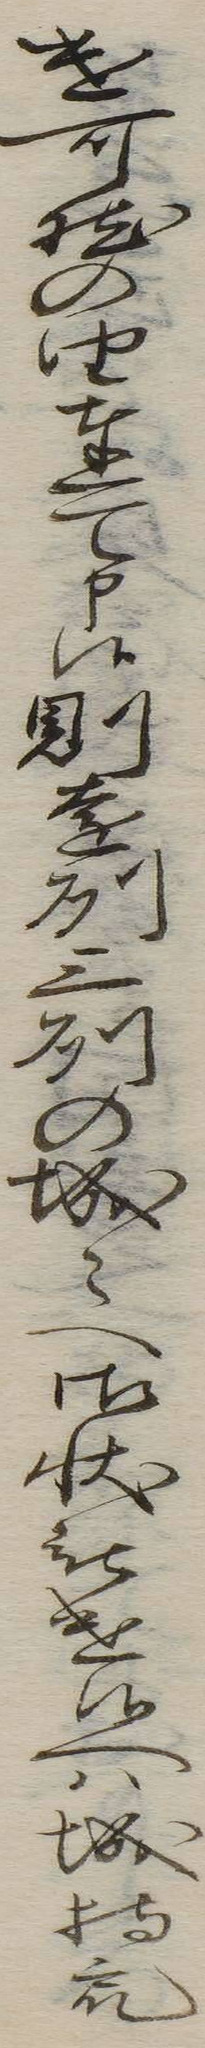遣可然の由達て申候則遠州三州の城々へ御状被遣候へは城持衆
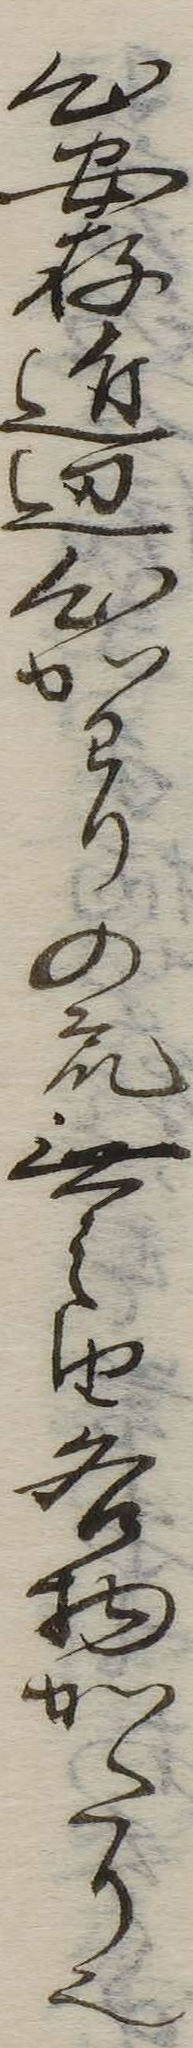心安存近辺心かわりの衆無之由各物かたり也
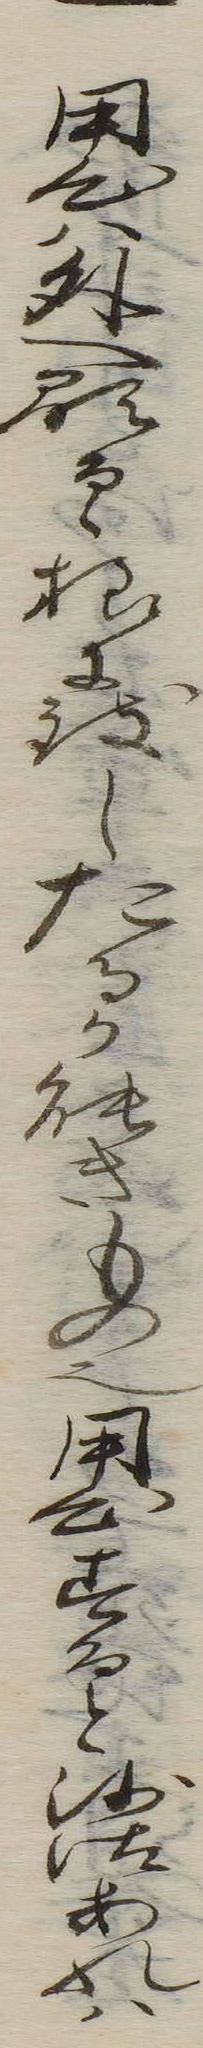一用心は外へ顕るゝ様に致したるか能きもの也用心すると沙汰あれは
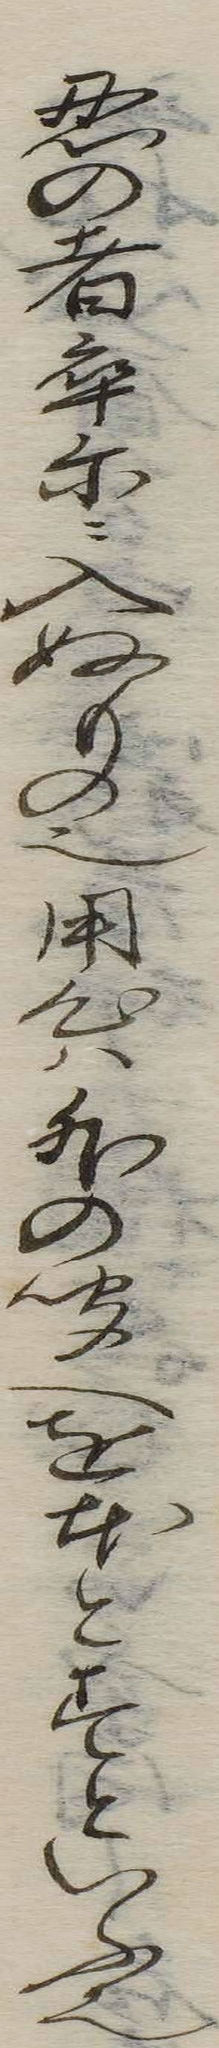忍の者卒爾ニ入ぬもの也用心は外の聞へを本とすといふ也
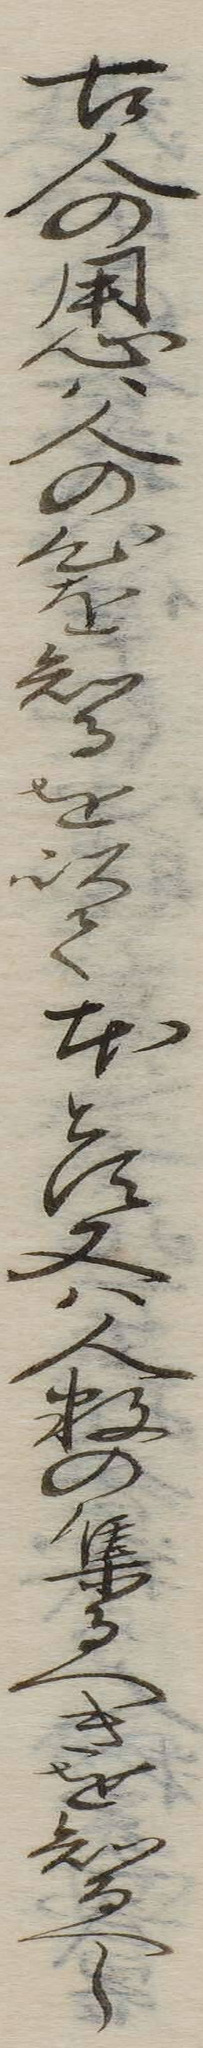一古人の用心は人の心を知るを以て本とす又は人数の集るへきを知るへし
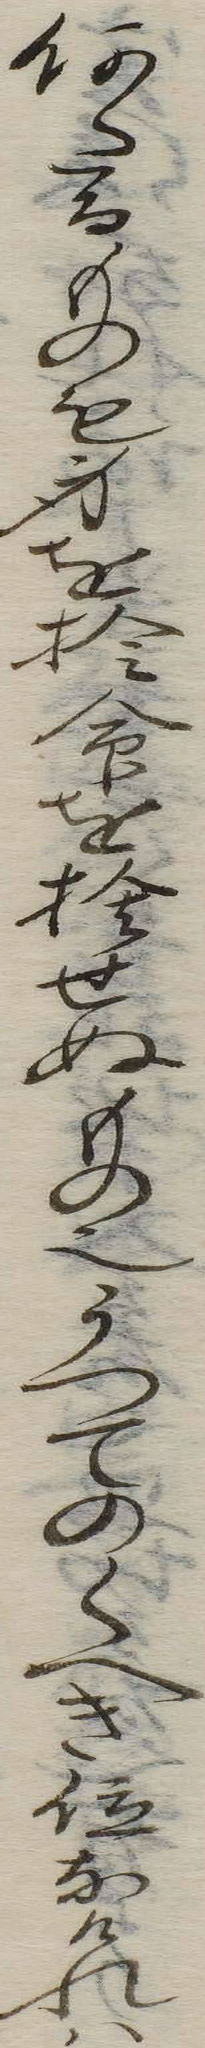何たるものも身を捨命を捨せぬもの也うつてのくへき位なけれは
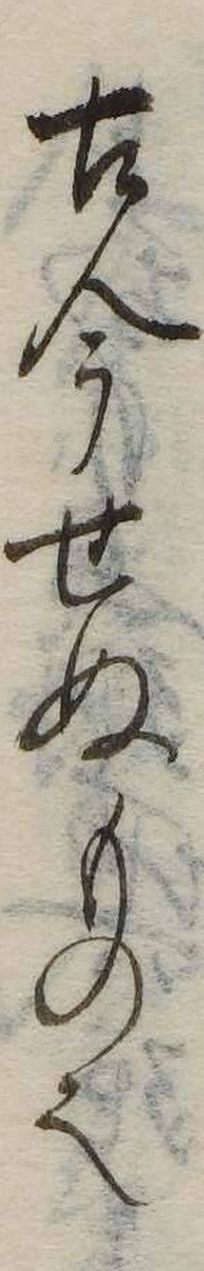古今せぬもの也
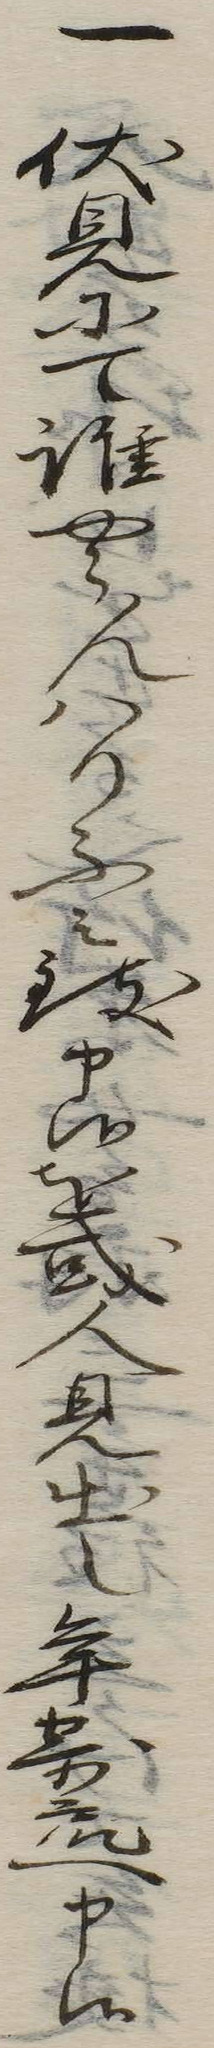一伏見にて誰やらんはりふみ致申候を或人見出し年寄衆へ申候
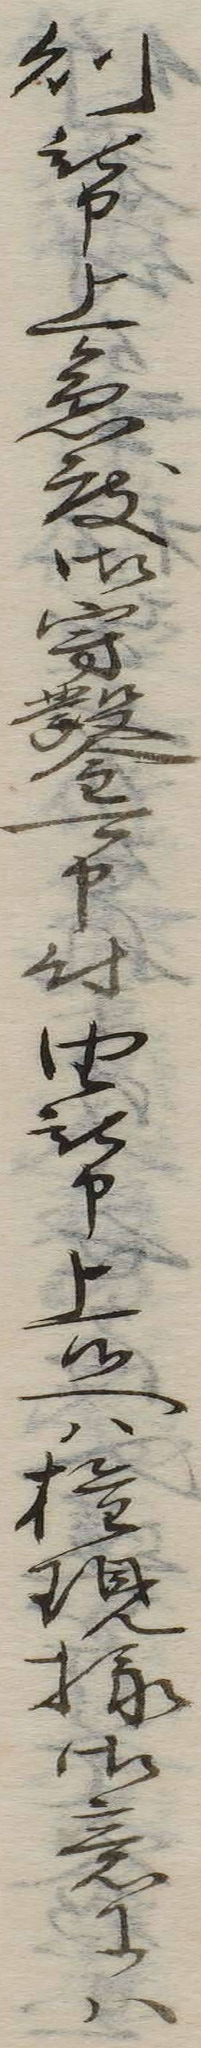則被申上急度御穿鑿金可申付由被申上候へは権現様御意には
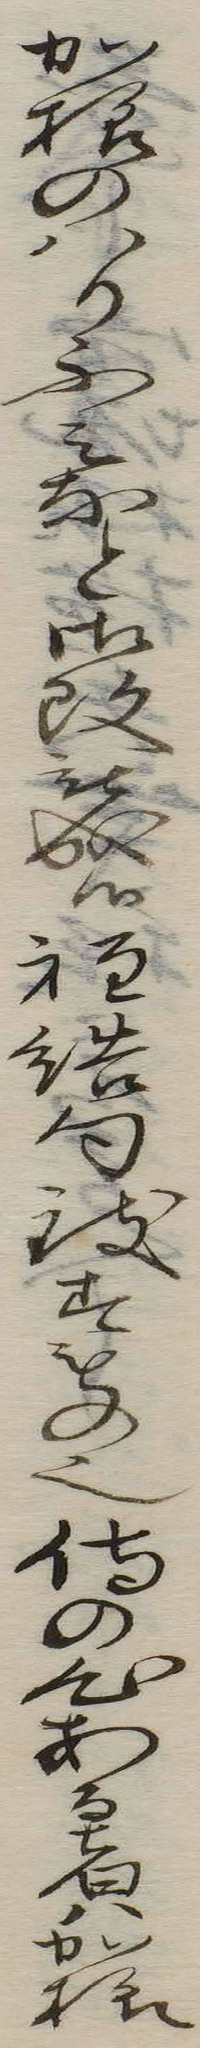か様のはりふみなと御改被成候程結句致すもの也侍の心ある者はか様
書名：三河之物語
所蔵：国文学研究資料館
